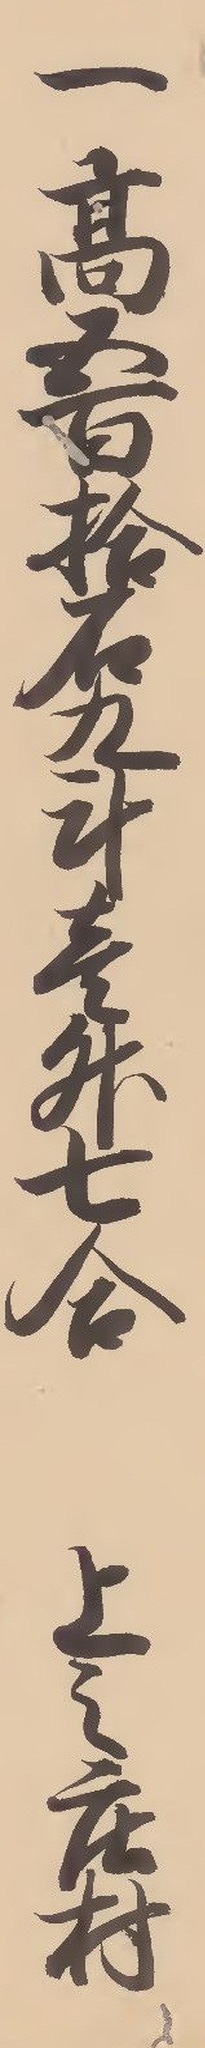一高五百拾石九斗壱升七合上之庄村
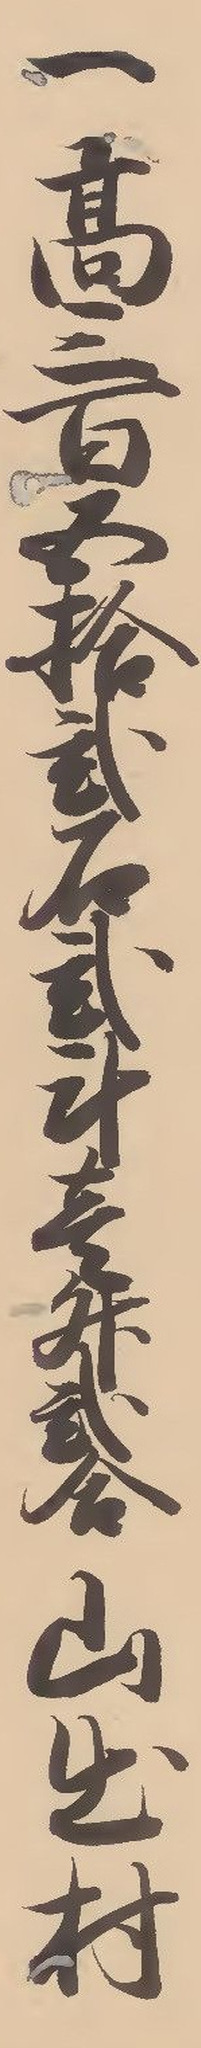一高三百五拾弐石弐斗壱升弐合山出村

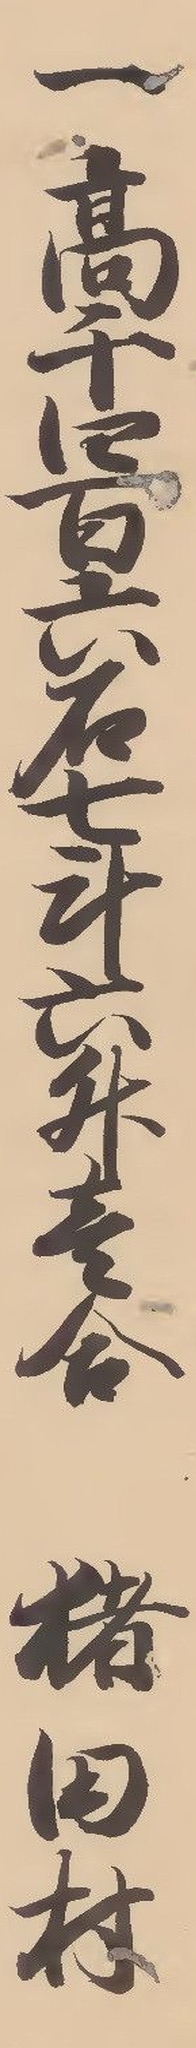一高千四百六石七斗六升壱合猪田村
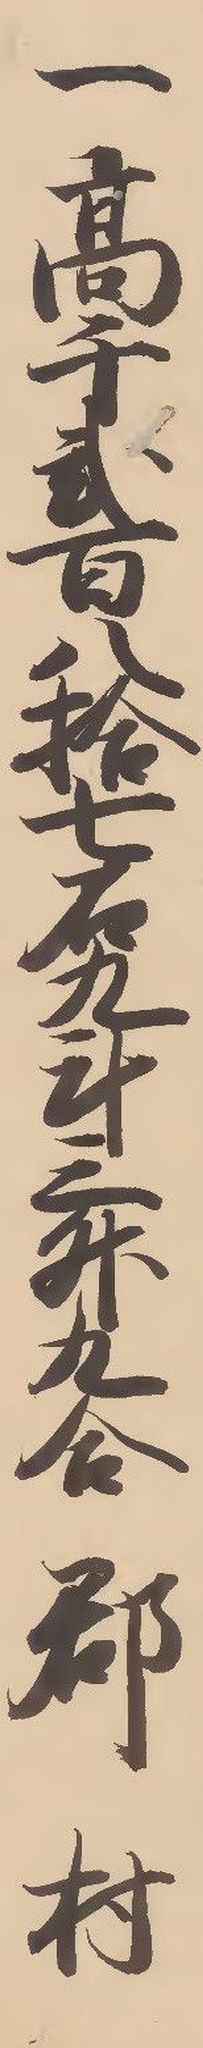一高千弐百八拾七石九斗三升九合郡村
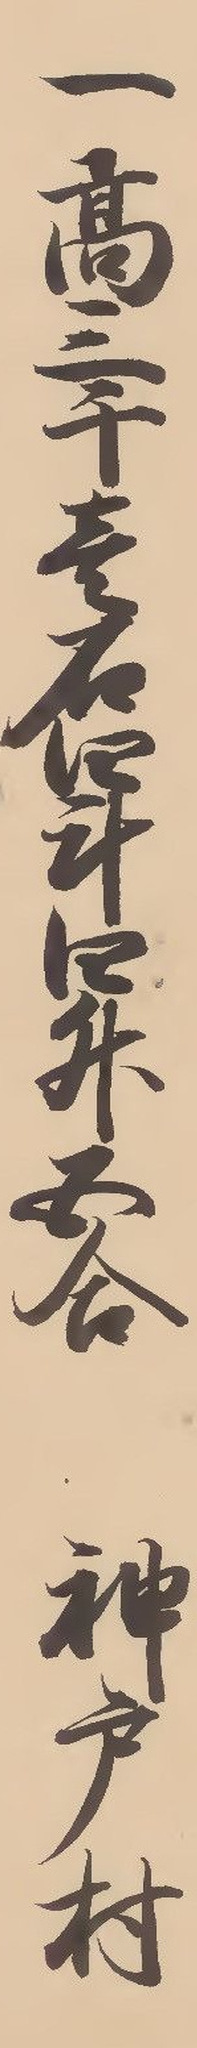一高三千壱石四斗四升五合神戸村
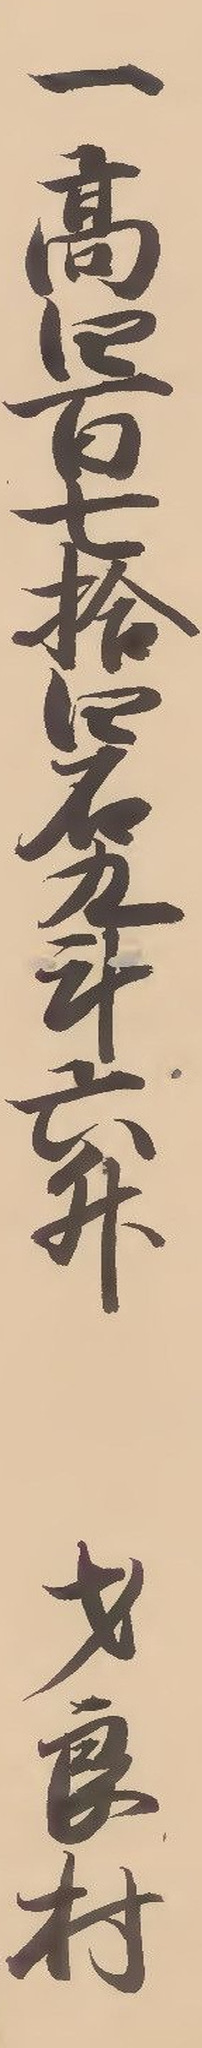一高四百七拾四石九斗六升才良村
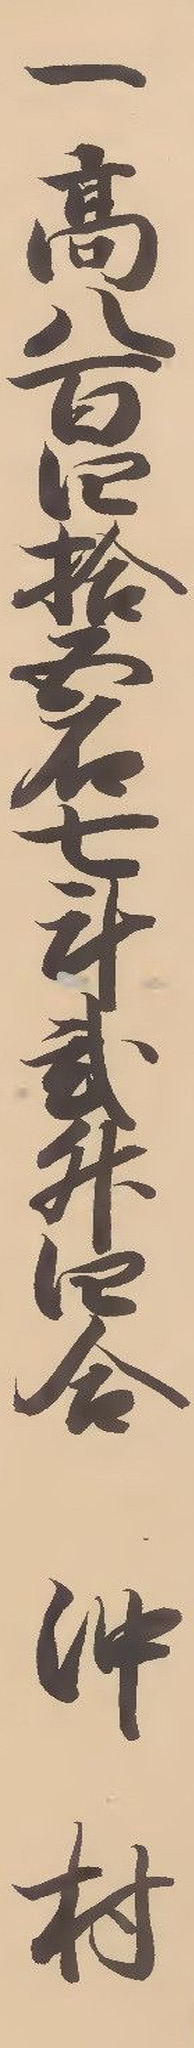一高八百四拾五石七斗弐升四合沖村
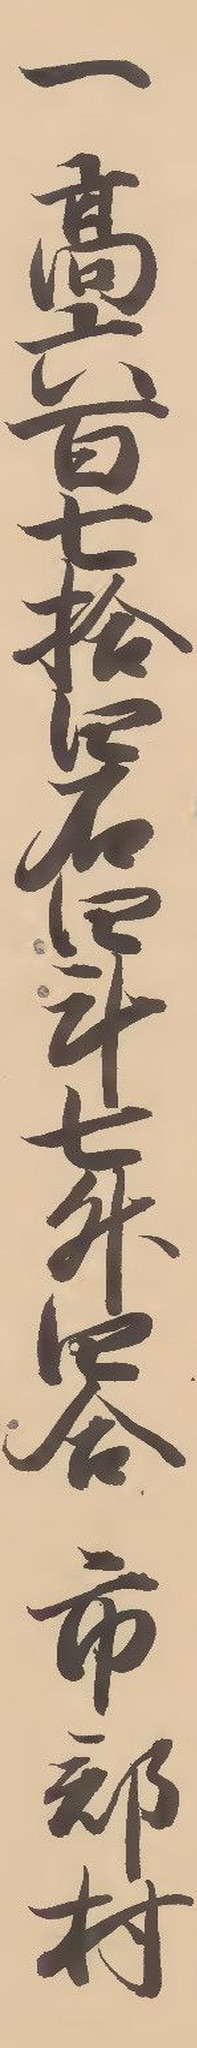一高六百七拾四石四斗七升四合市部村
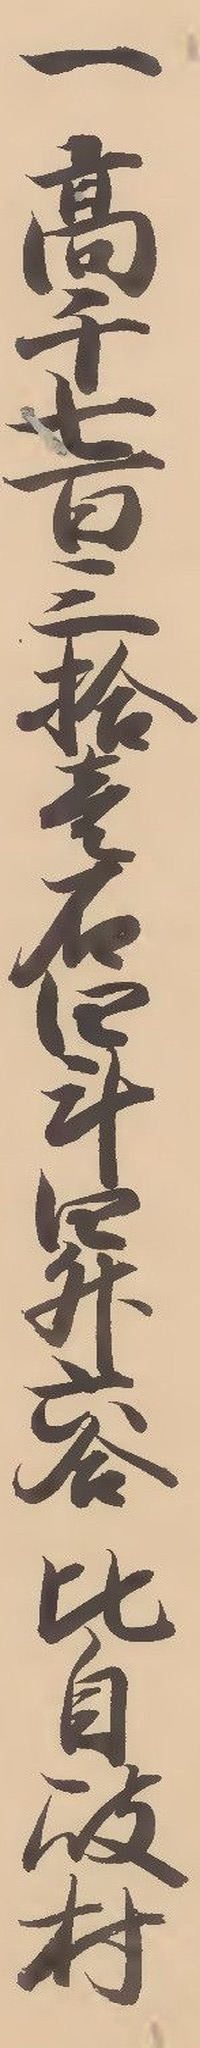一高千七百三拾壱石四斗四升六合比自岐村
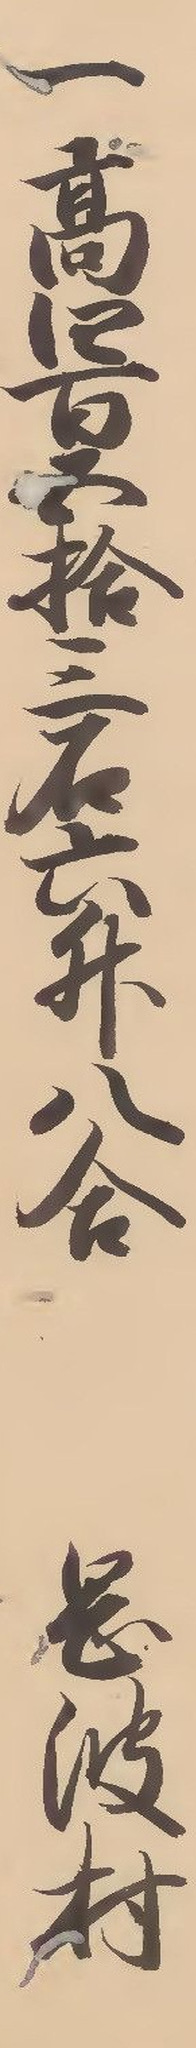一高四百五拾三石六升八合岡波村

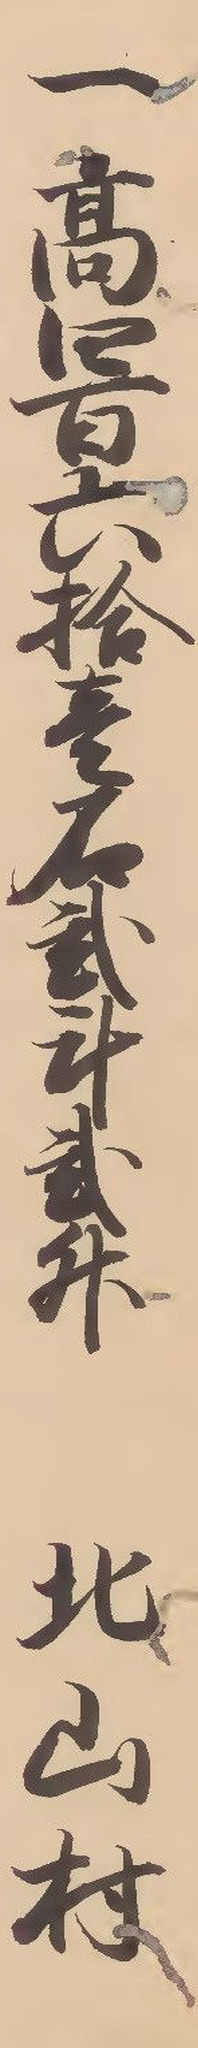一高四百六拾壱石弐斗弐升北山村
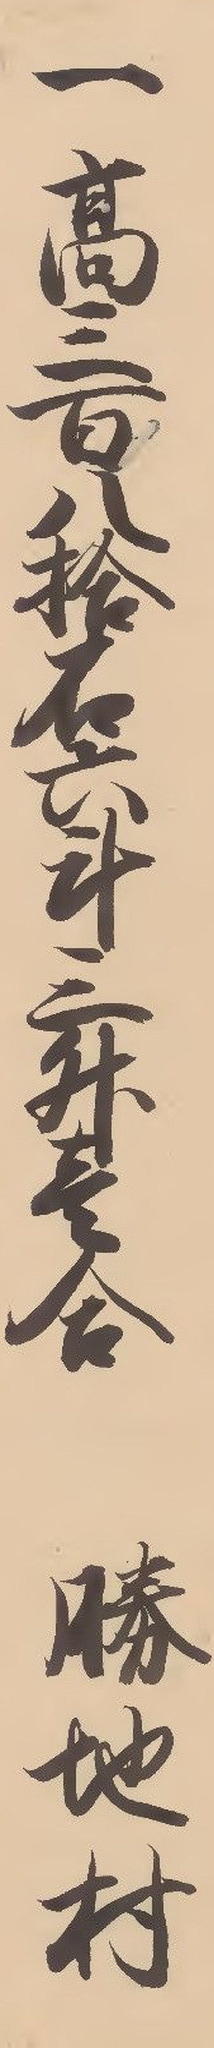一高三百八拾石六斗三升壱合勝地村
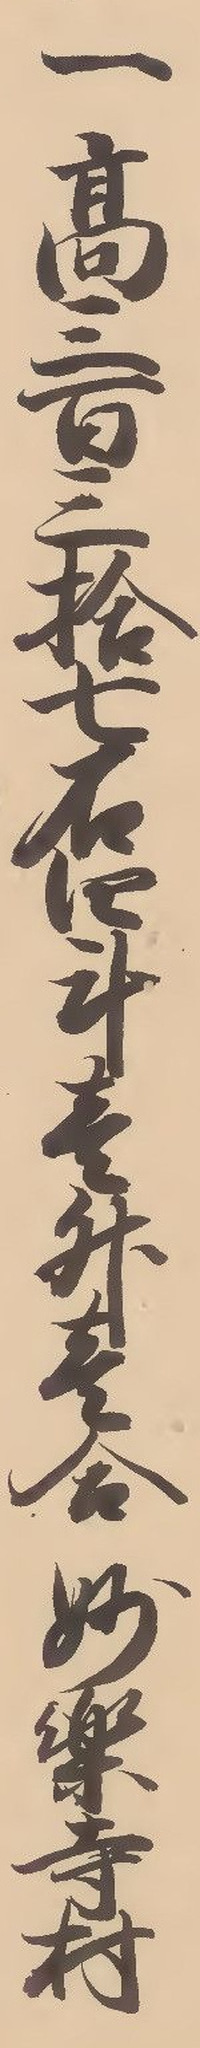一高三百三拾七石四斗壱升壱合妙楽寺村
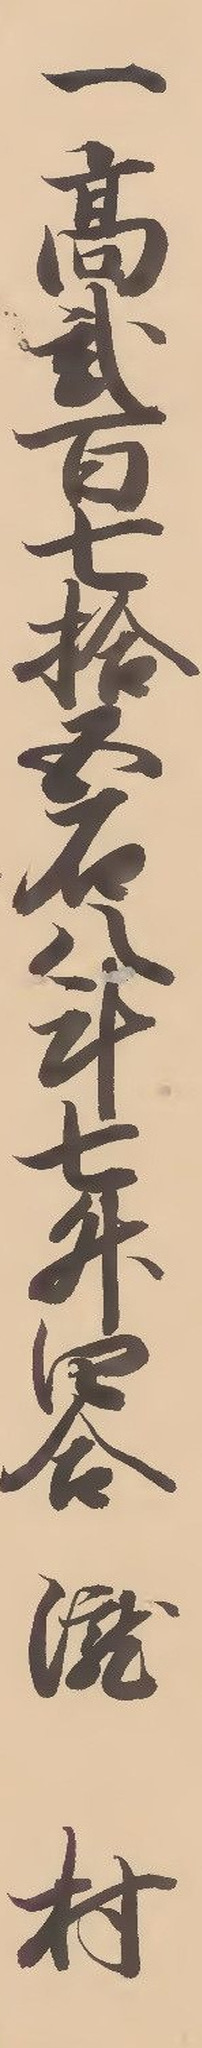一高弐百七拾五石八斗七升四合滝村
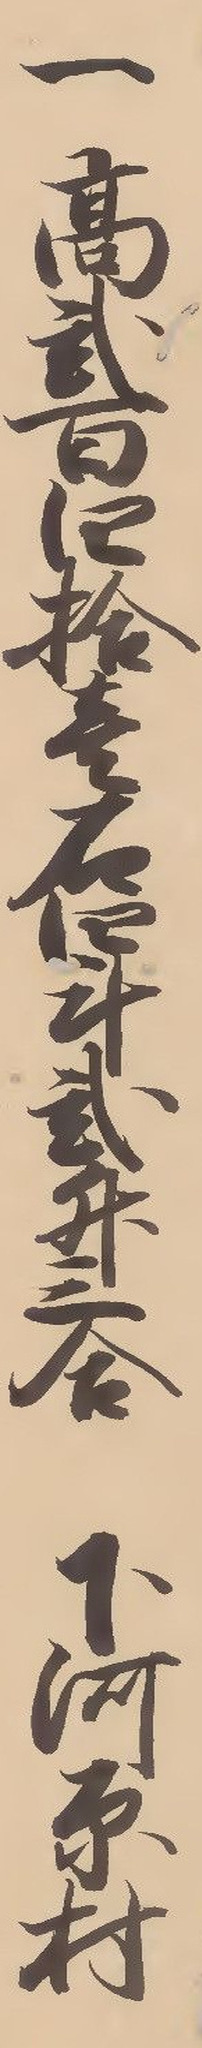一高弐百四拾壱石四斗弐升三合下河原村
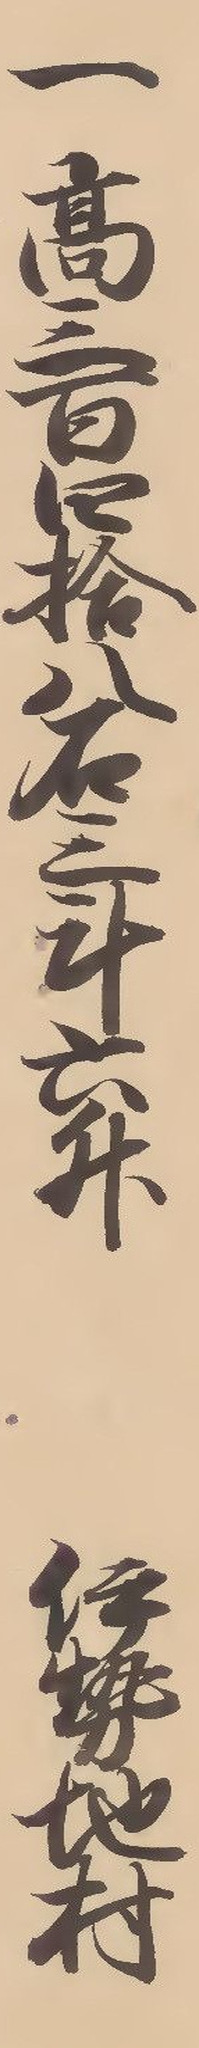一高三百四拾八石三斗六升伊勢地村
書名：伊賀国郷帳
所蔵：国立公文書館 National Archives of Japan
